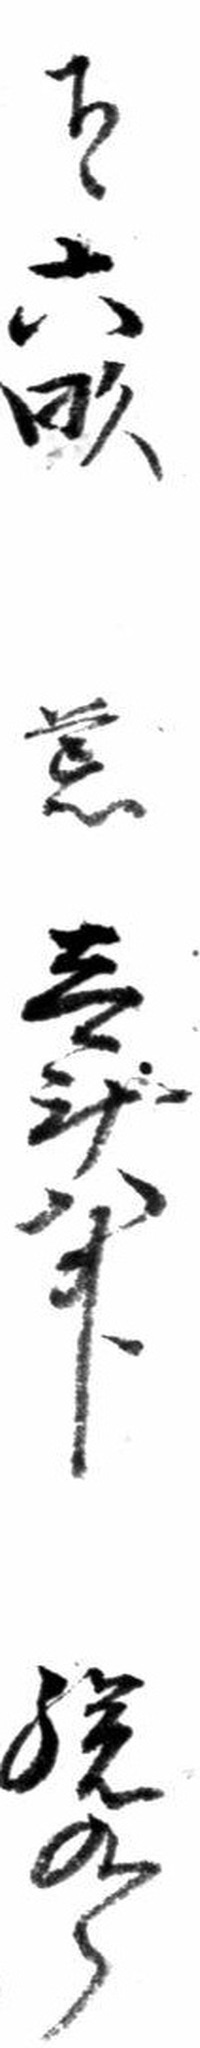下々六畝荒壱斗八升孫九郎
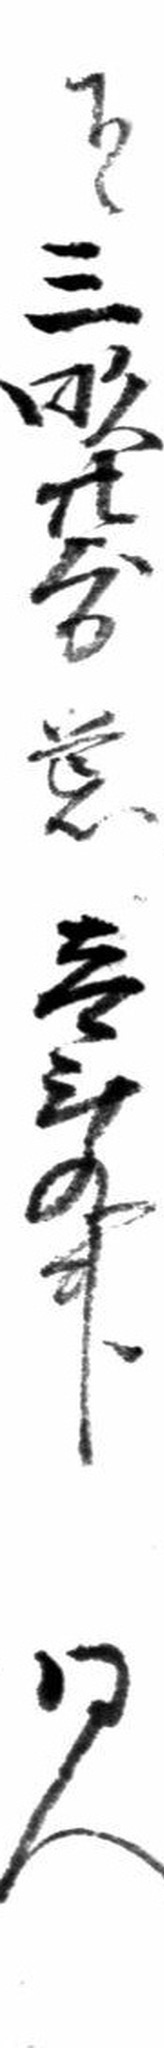下々三畝廿歩荒壱斗九升同人
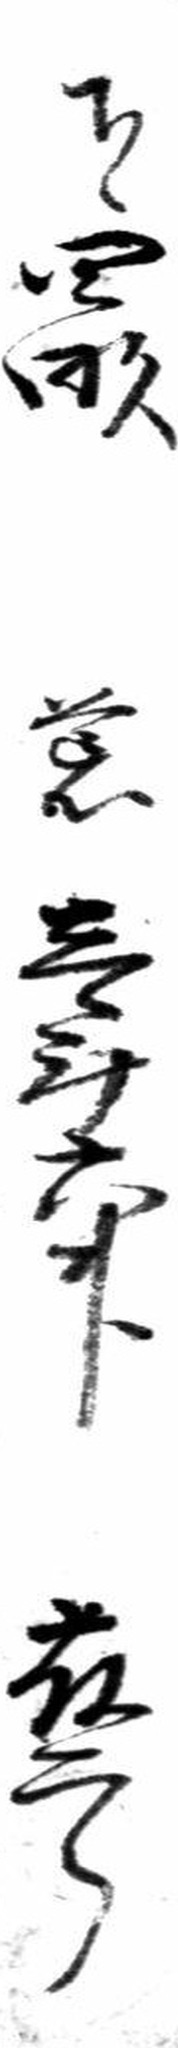下々四畝荒壱斗六升藤二郎

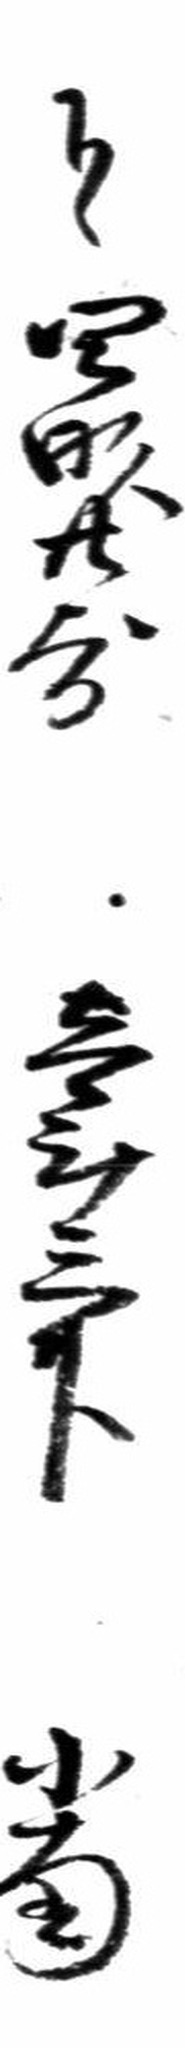下々四畝廿歩壱斗三升小南
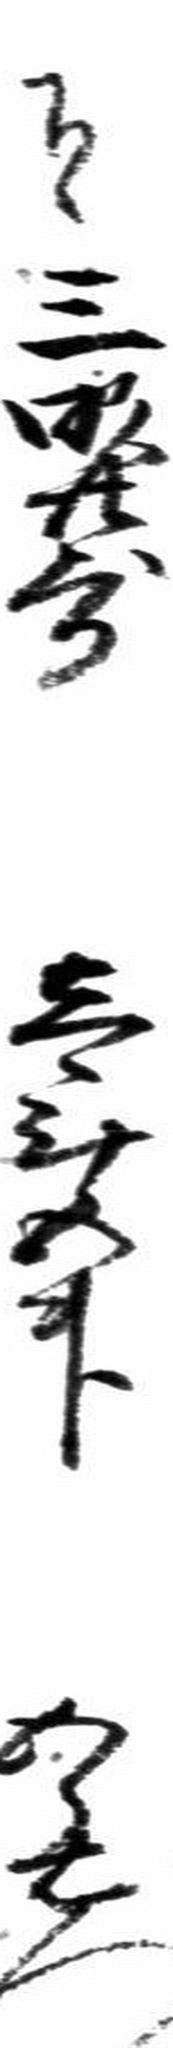下々三畝廿歩壱斗五升五郎右衛門
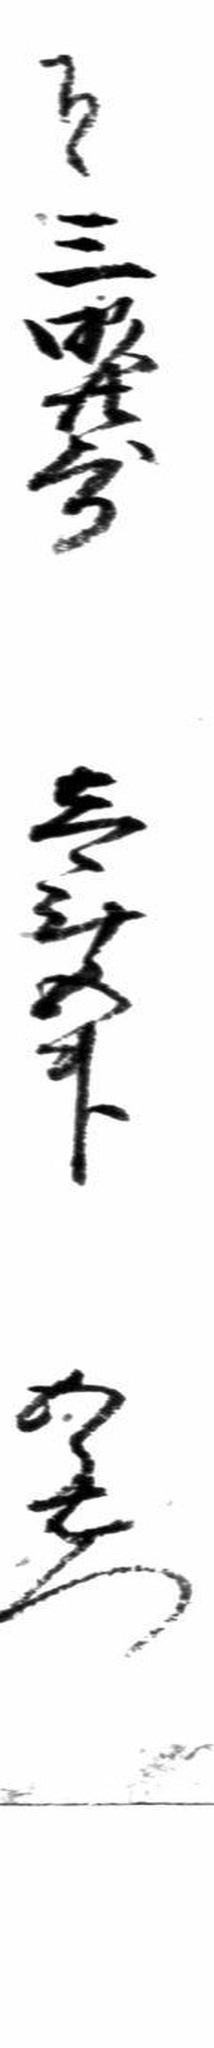下々三畝廿歩壱斗五升五郎右衛門
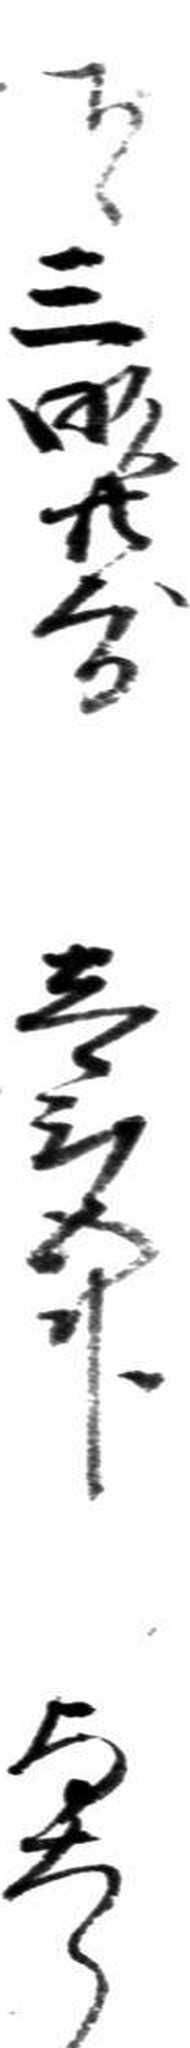下々三畝廿歩壱斗五升与大郎
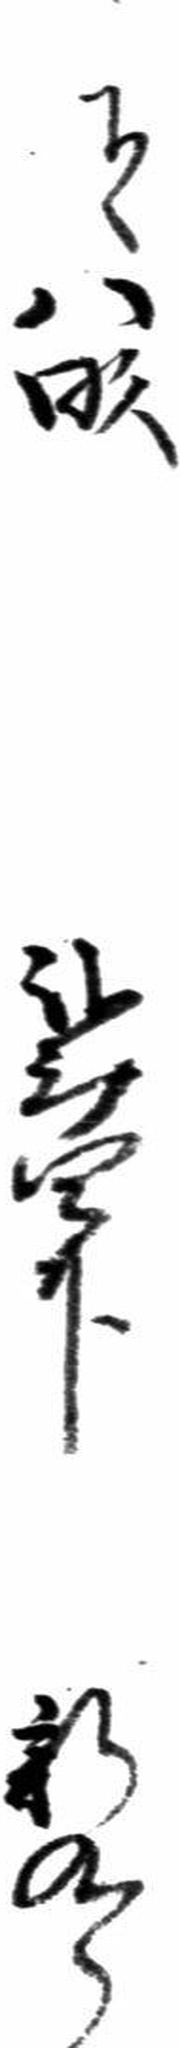下々八畝弐斗四升新九郎
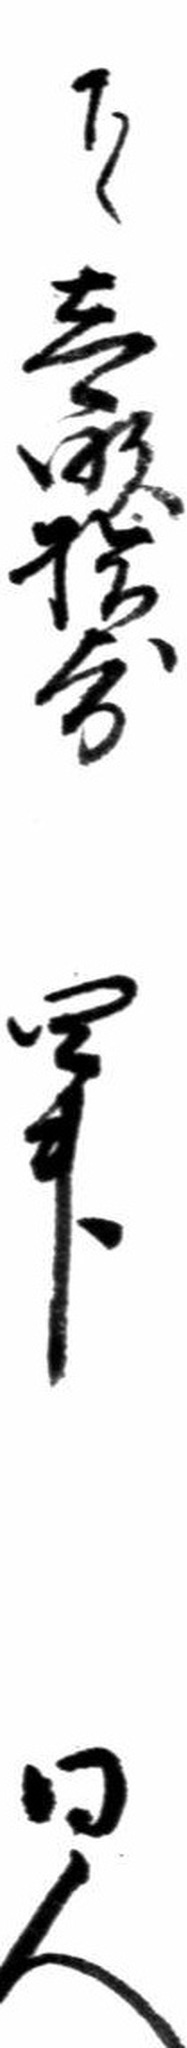下々壱畝拾歩四升同人
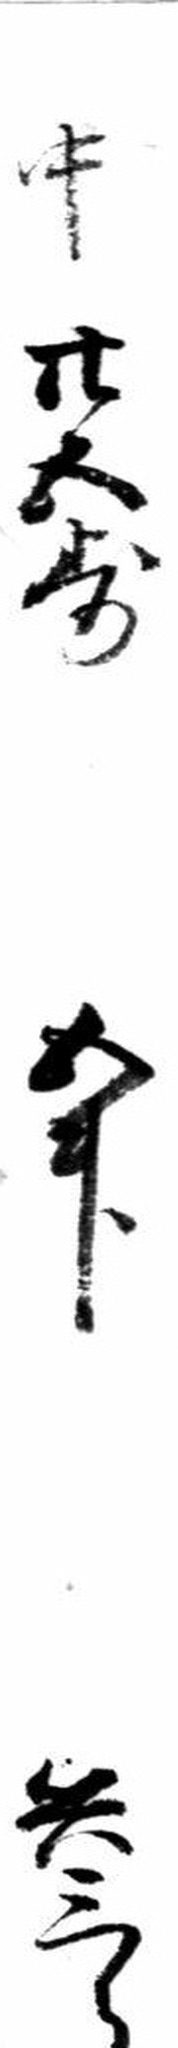中廿五歩五升兵三郎
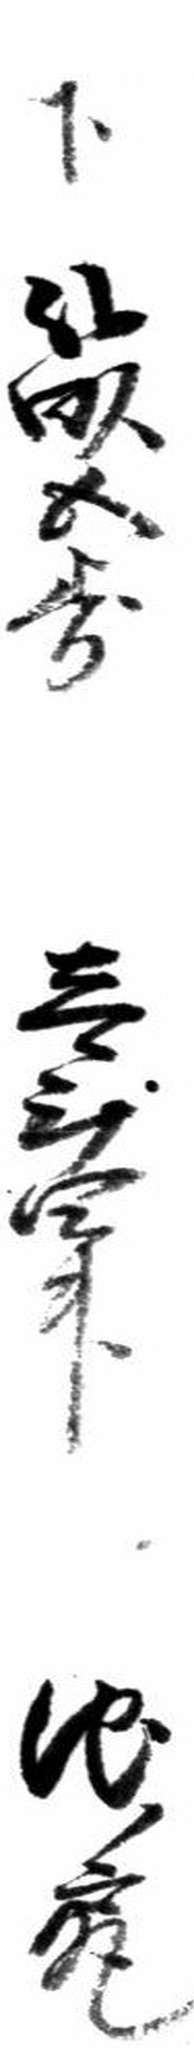下弐畝五歩壱斗四升池ノ尻
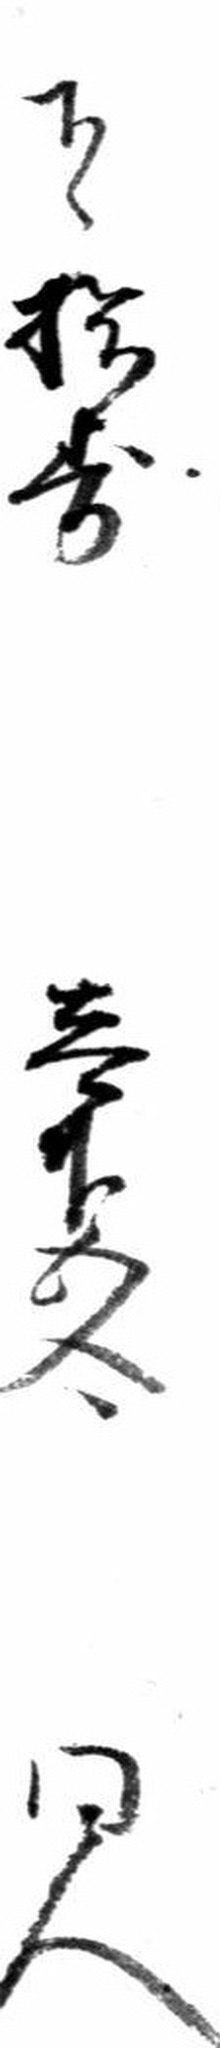下々拾歩壱升五合同人
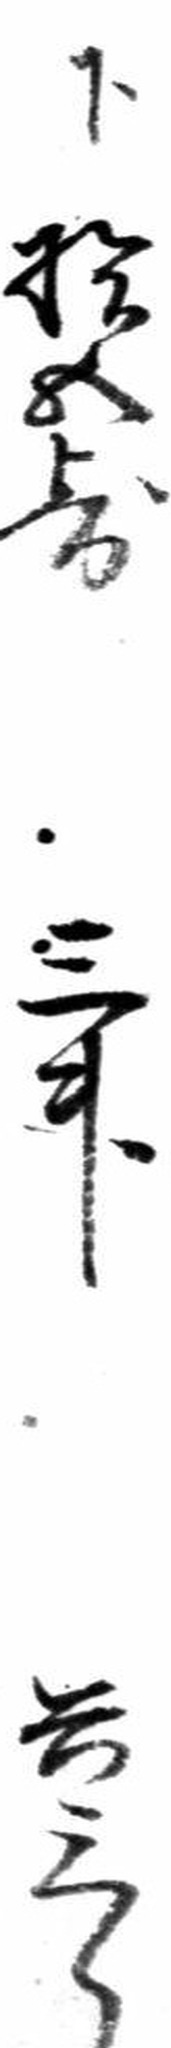下拾五歩三升兵三郎

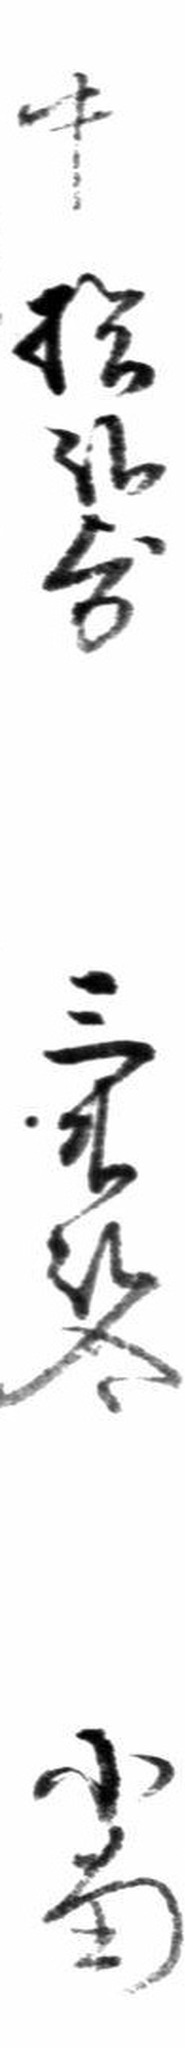中拾弐歩三升弐合小南
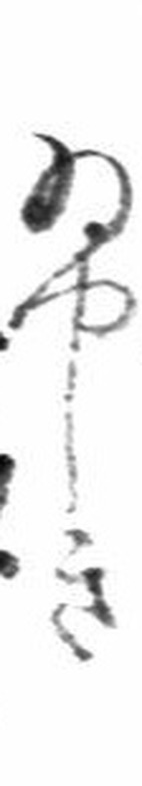ゐやしき
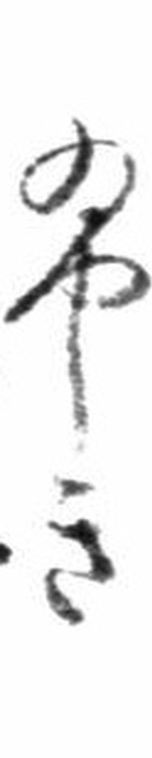ゐやしき
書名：若州三方郡之内世久見浦御検地帳（世久見浦検地帳写）
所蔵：福井県文書館 Fukui Prefectural Archives
